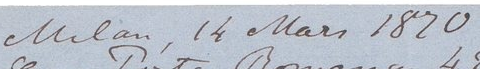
Milan, 14 Mars 1870
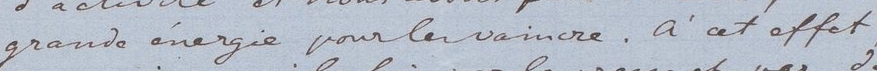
grande énergie pour les vaincre. À cet effet,
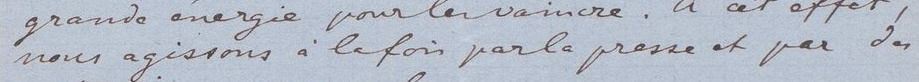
nous agissons à la fois par la presse et par des
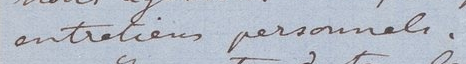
entretiens personnels.
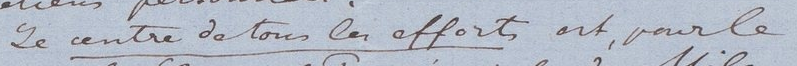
Le centre de tous les efforts est, pour le
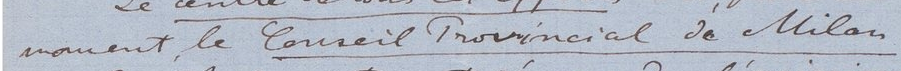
moment, le Conseil Provincial de Milan
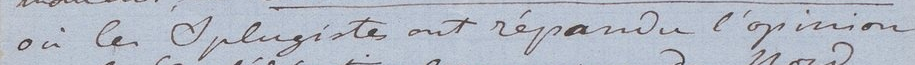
où les Splugistes ont répandu l'opinion
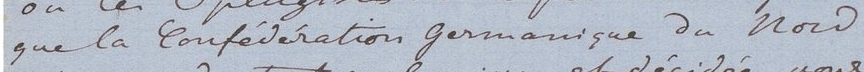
que la Confédération Germanique du Nord
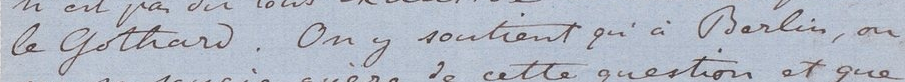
le Gothard. On y soutient qu'à Berlin, on
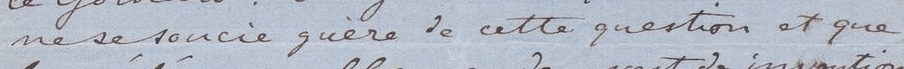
ne se soucie guère de cette question et que
